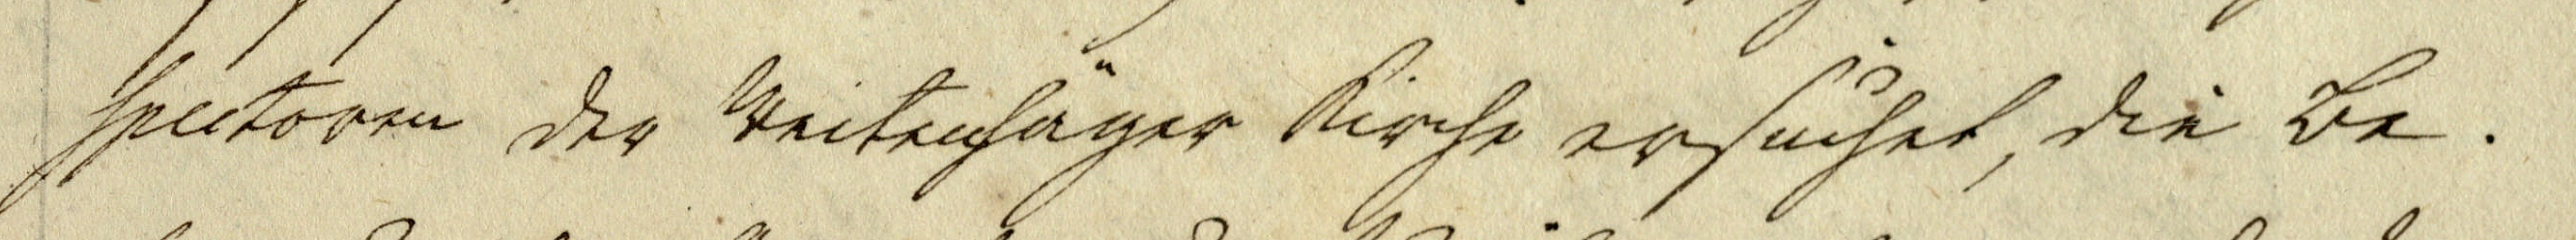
spectorem der Weitenhäger Kirche ersuchet, die Be¬
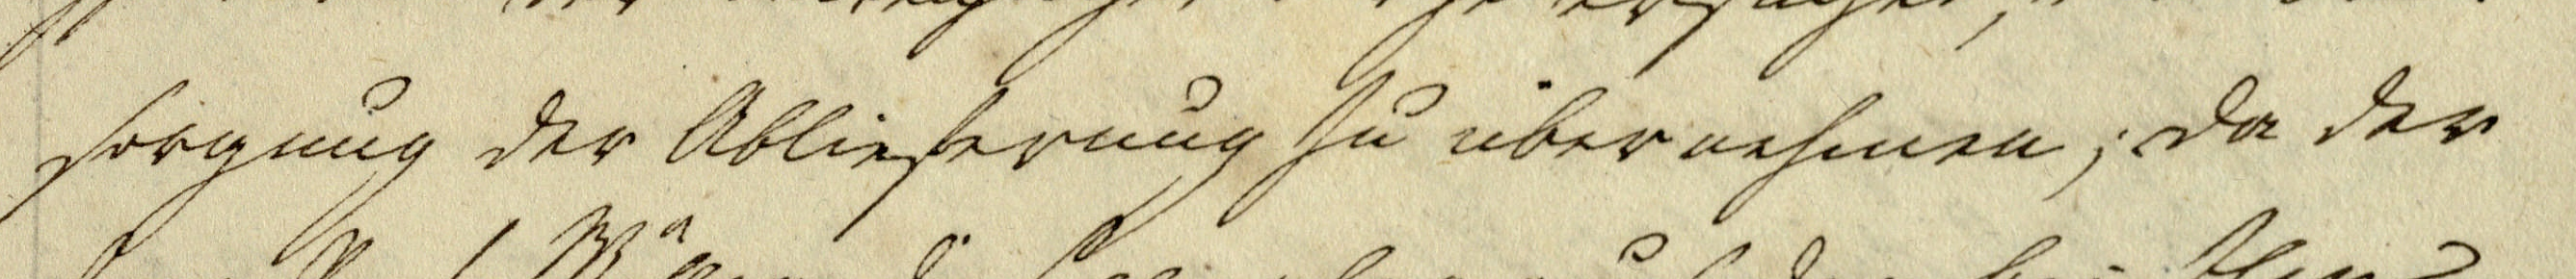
sorgung der Ablieferung zu übernehmen, da der
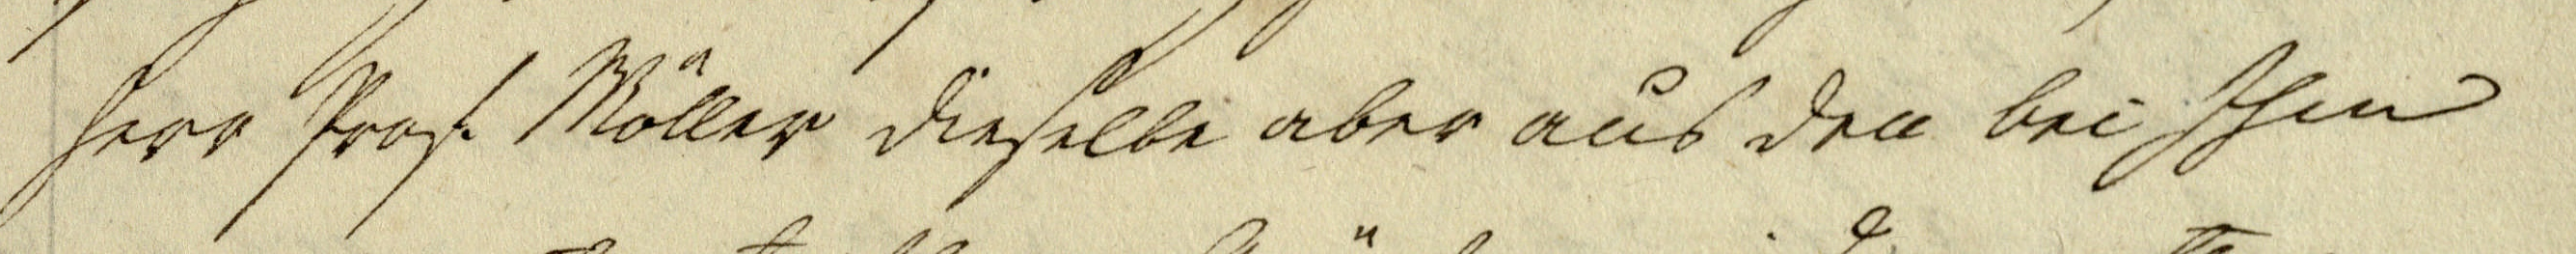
Herr Prof. Möller dieselbe aber aus den bei Ihm
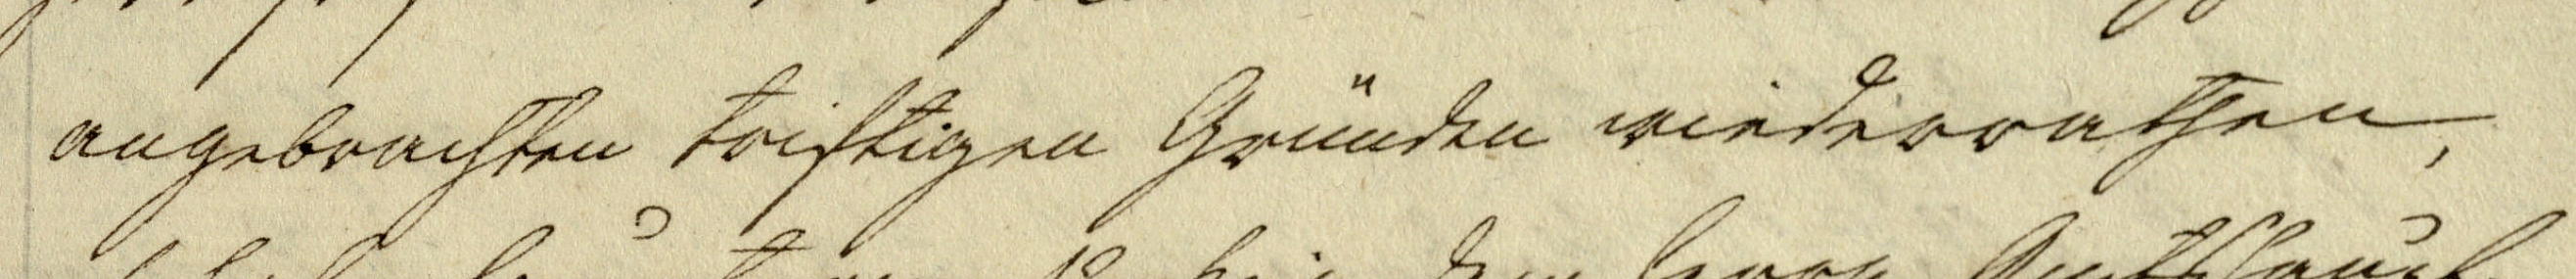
angebrachten triftigen Gründen wiederrathen,
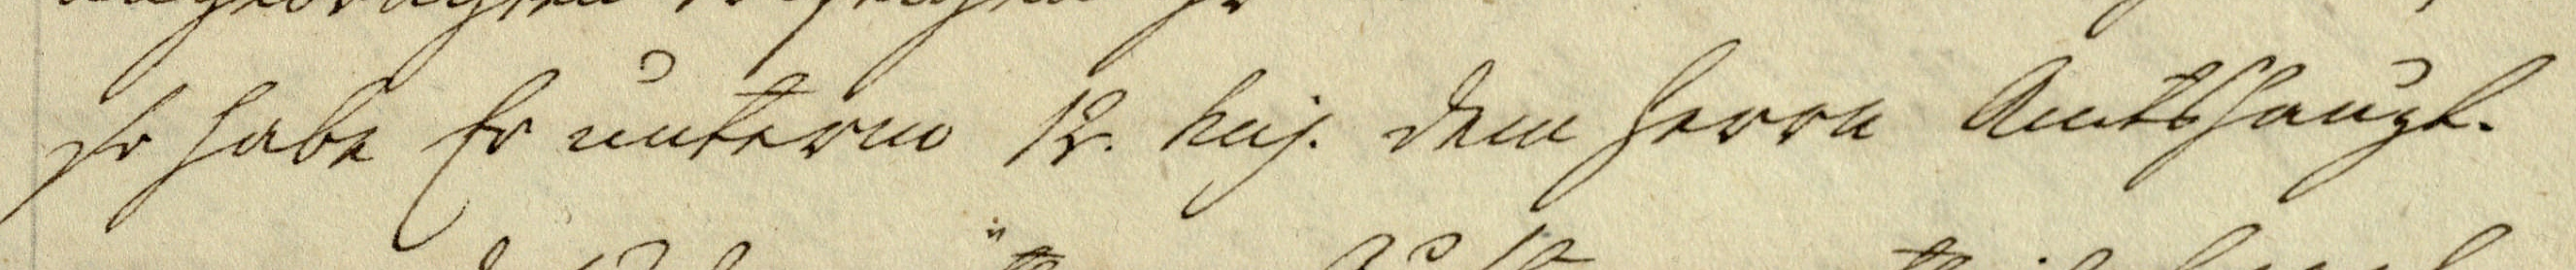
so habe Er unterm 12. huj. dem Herrn Amtshaupt¬
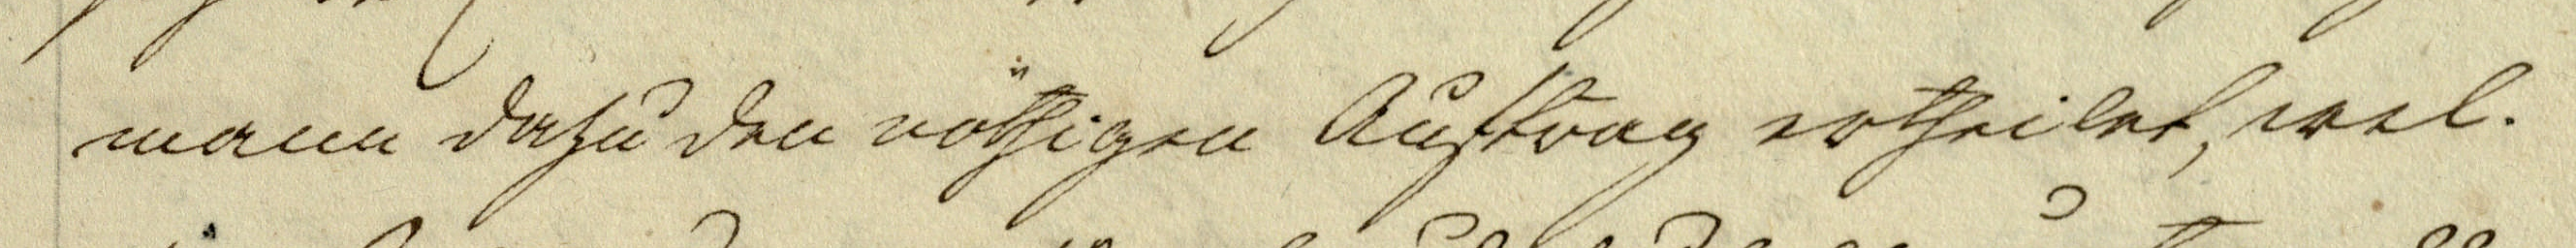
mann dazu den nöthigen Auftrag ertheilet, wel¬
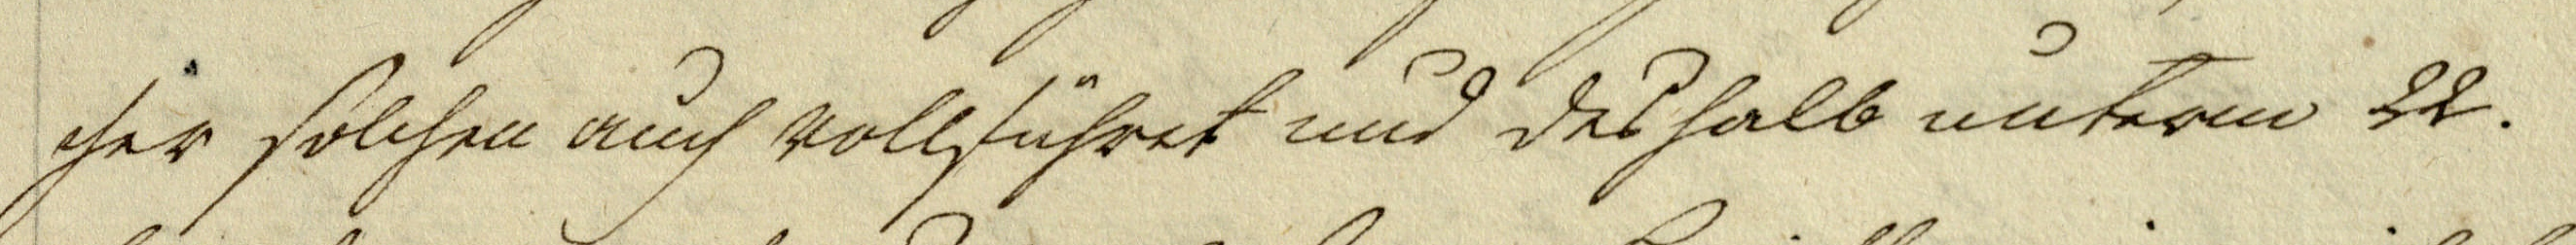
cher solchen auch vollführet und deshalb unterm 22.
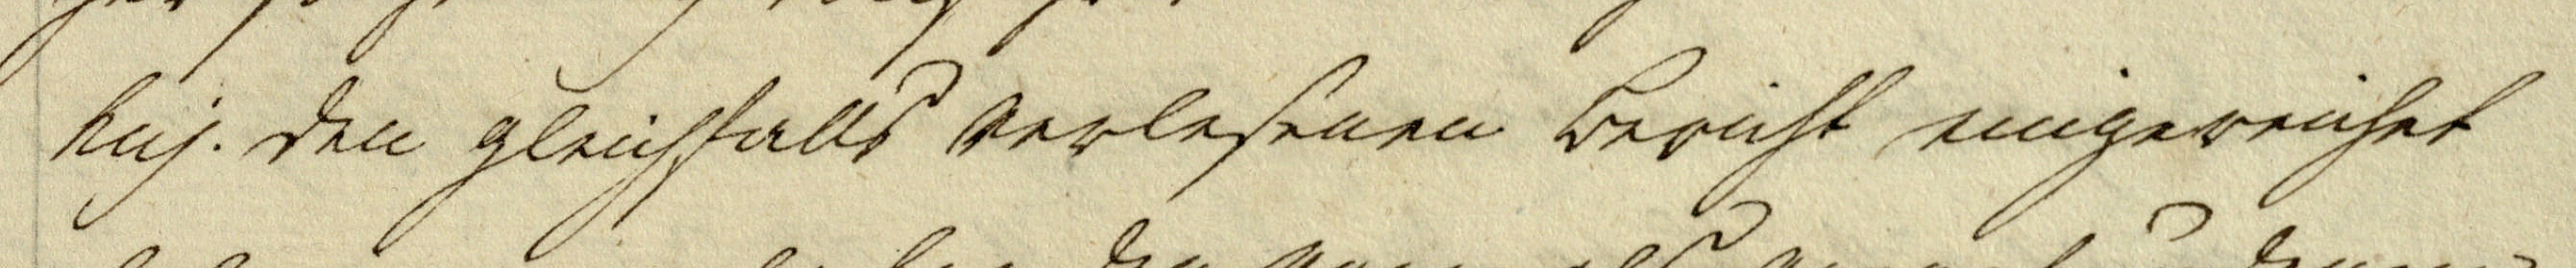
huj. den gleichfalls verlesenen Bericht eingereichet
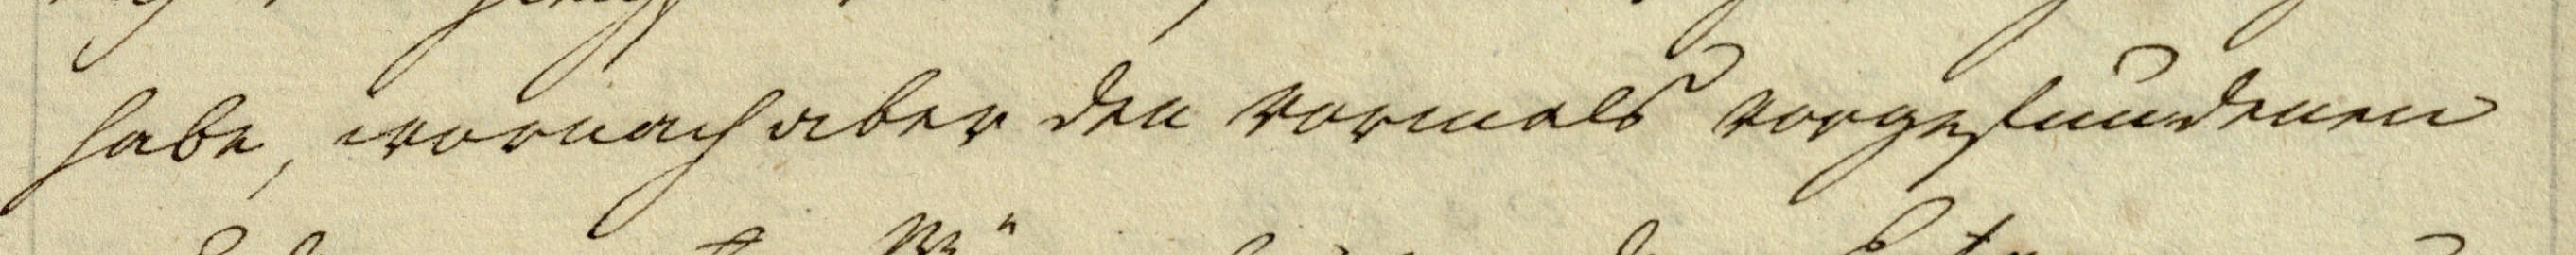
habe, wornach aber den vormals vorgefundenen
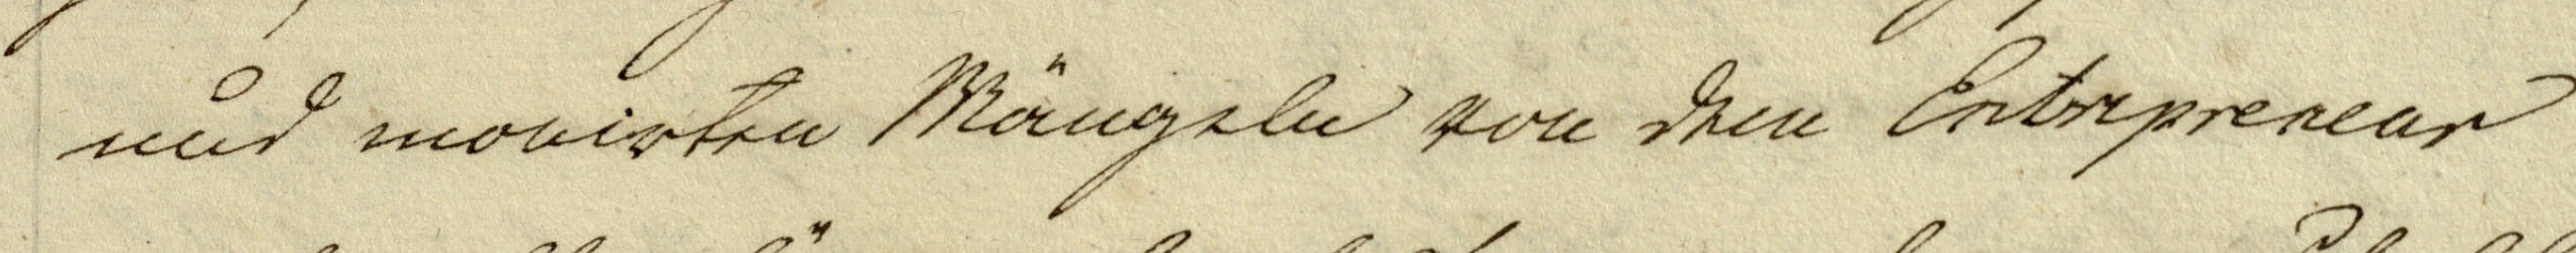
und monirten Mängeln von dem Entrepreneur
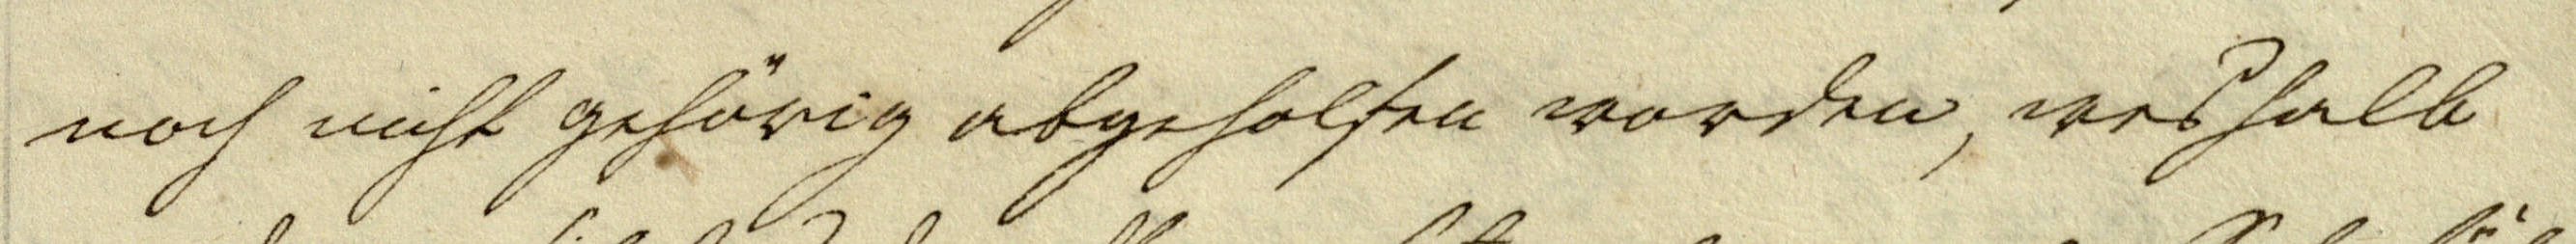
noch nicht gehörig abgeholfen worden, weshalb
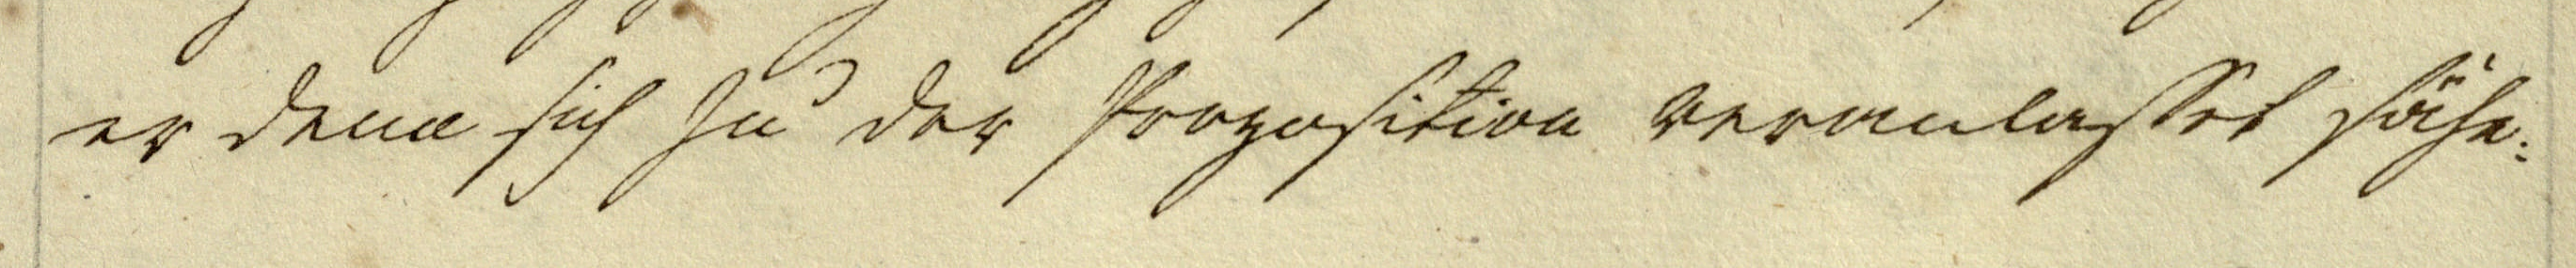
er denn sich zu der Proposition veranlasset sähe:
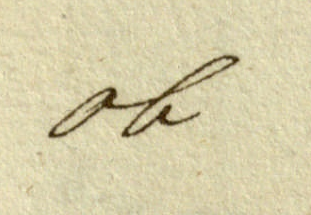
ob
